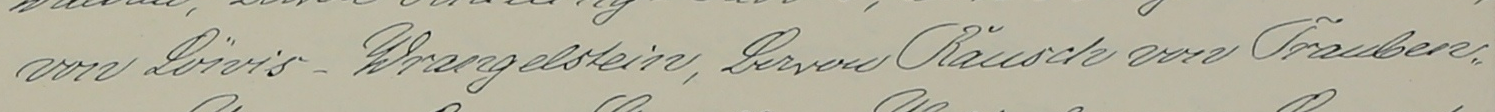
von Löwis-Wrangelstein, Baron Rausch von Trauben-
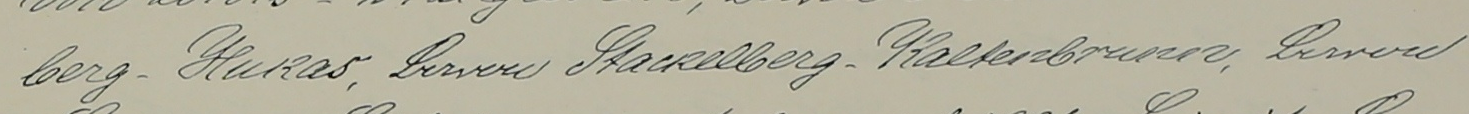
berg-Hukas, Baron Stackelberg-Kaltenbrunn, Baron
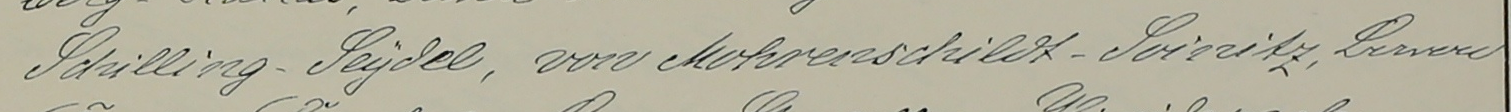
Schilling-Seydel, von Mohrenschildt-Soinitz, Baron
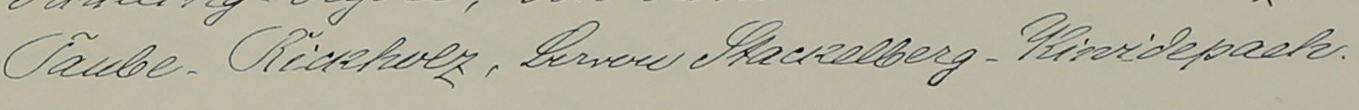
Taube-Rickholz, Baron Stackelberg-Kiwidepaeh.
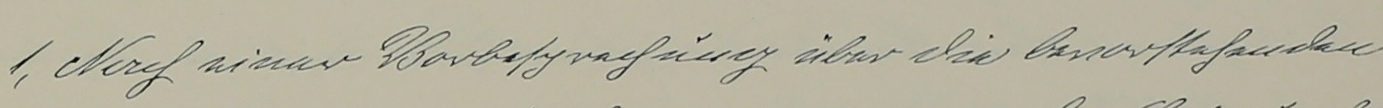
1. Nach einer Vorbesprechung über die bevorstehenden
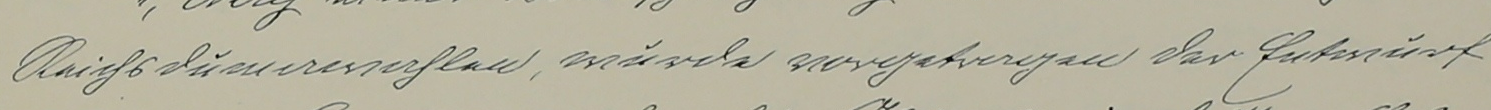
Reichsdumawahlen, wurde vorgetragen der Entwurf
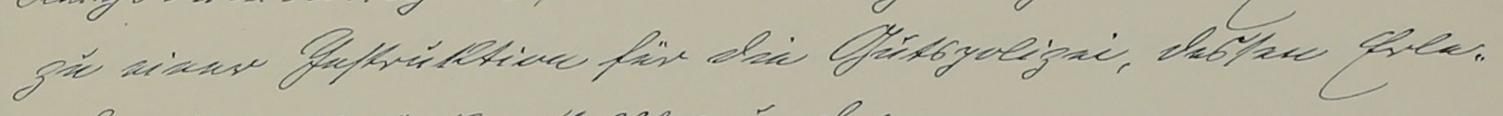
zu einer Instruktion für die Gutspolizei, dessen Erle-
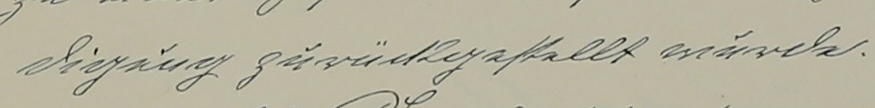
digung zurückgestellt wurde.
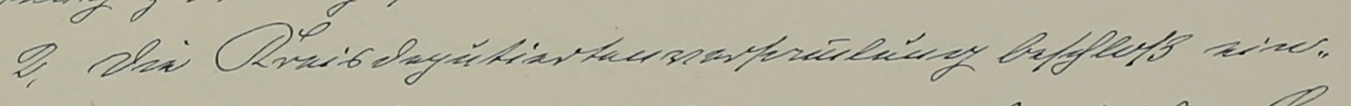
2. Die Kreisdeputiertenversammlung beschloß ein-
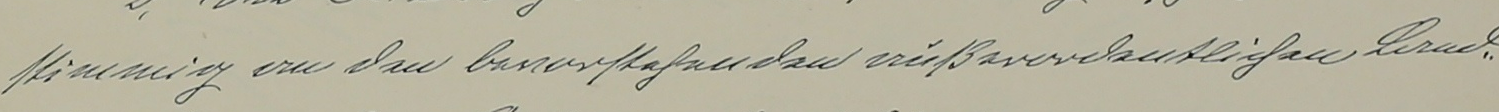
stimmig an den bevorstehenden außerordentlichen Land-
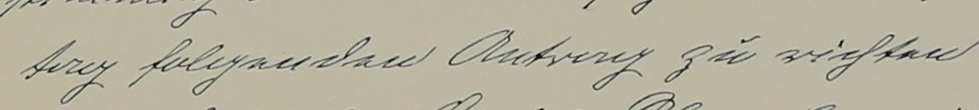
tag folgenden Antragzu richten:
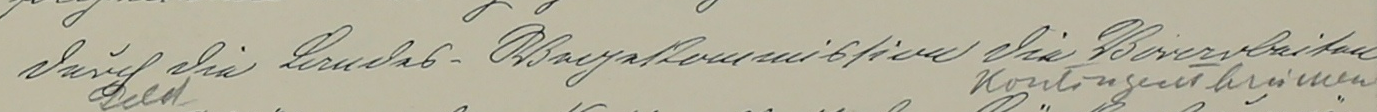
Durch die Landes-Wegekommission die Vorarbeiten
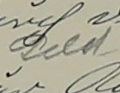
Geld
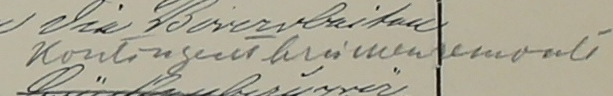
Kontingentbrückenremonte
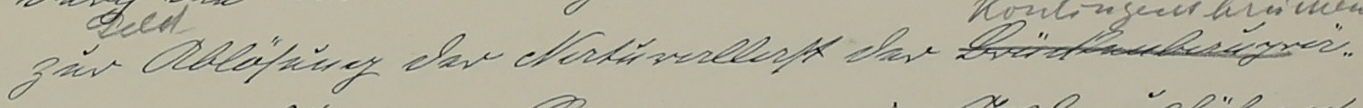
zur Ablösung der Naturallast der Brückenbauprä-
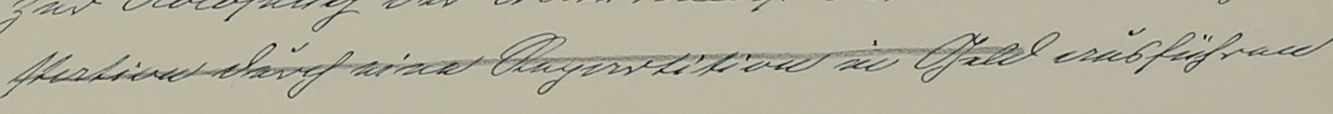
station durch eine Repartition in Geld ausführen
